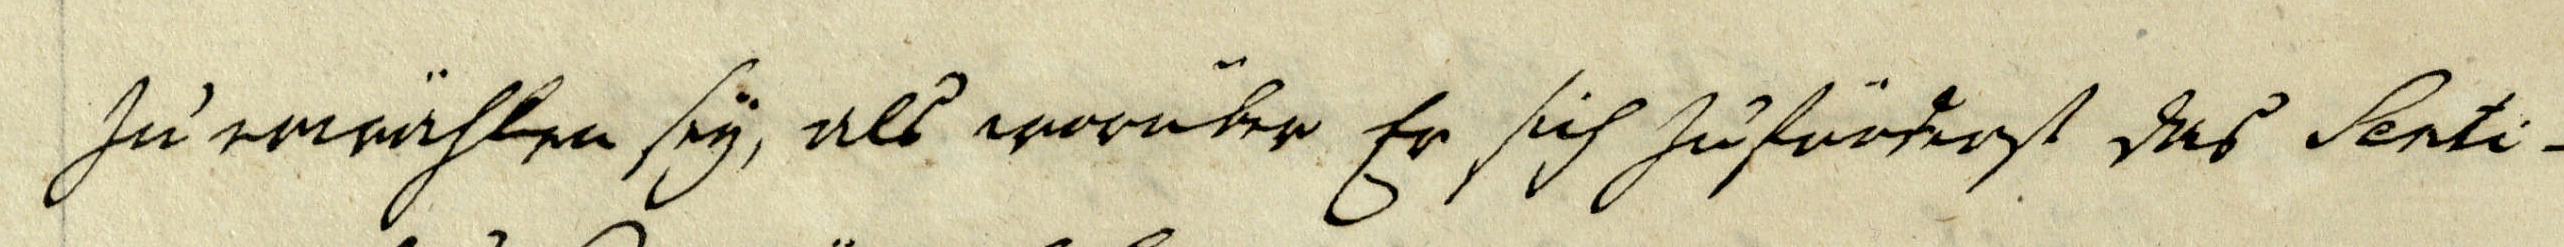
zu erwählen seÿ, als worüber Er sich zuförderst das Senti¬
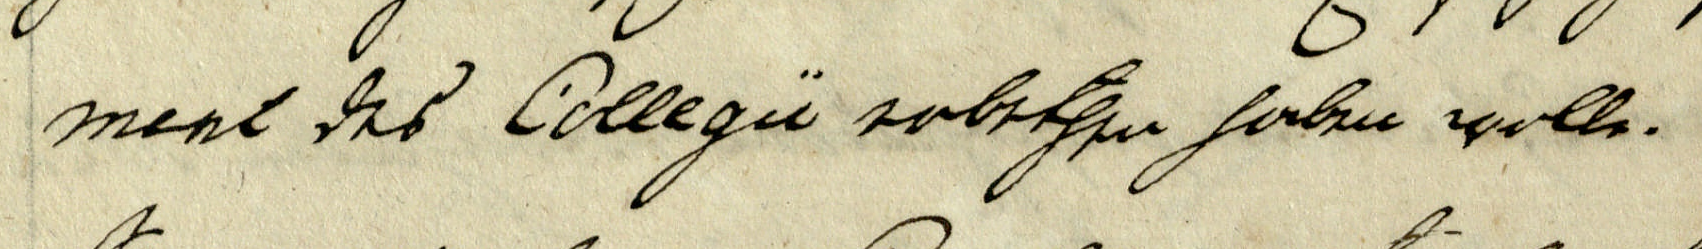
ment des Collegii erbethen haben wolle.
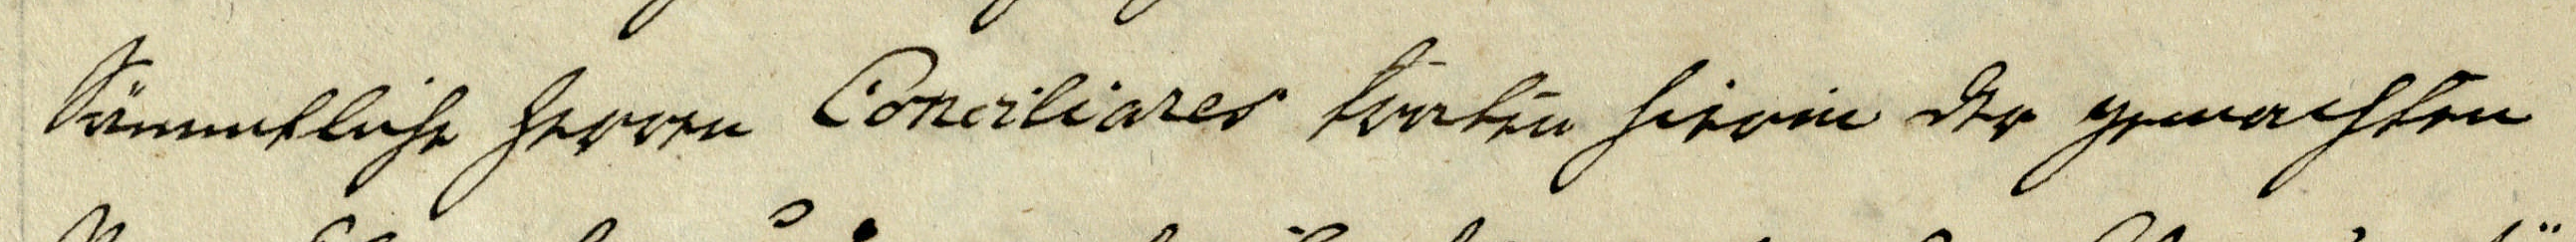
Sämmtliche Herren Conciliares traten hierin der gemachten
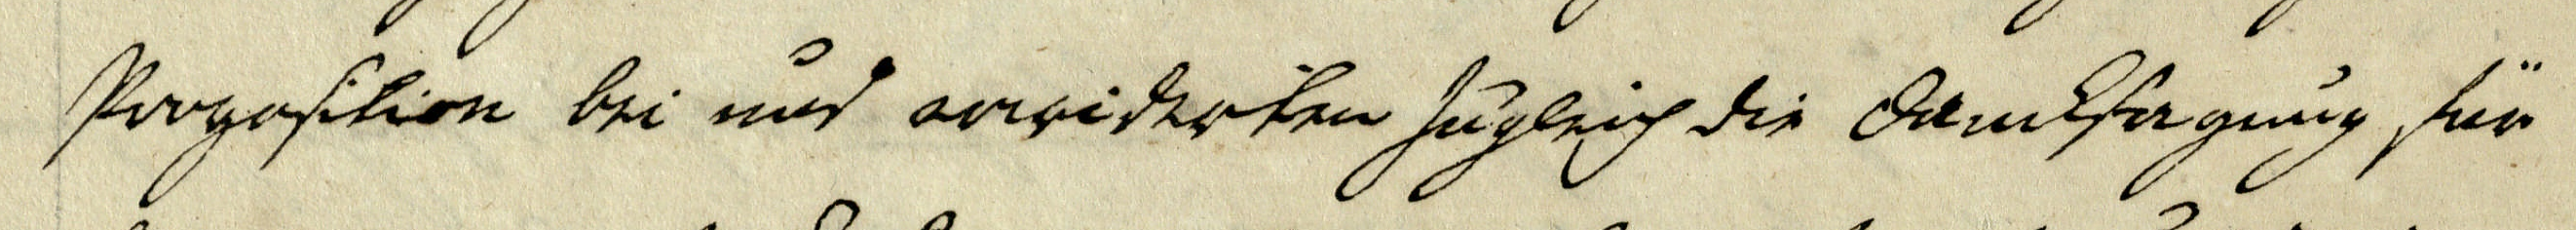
Proposition bei und erwiderten zugleich die Dancksagung für
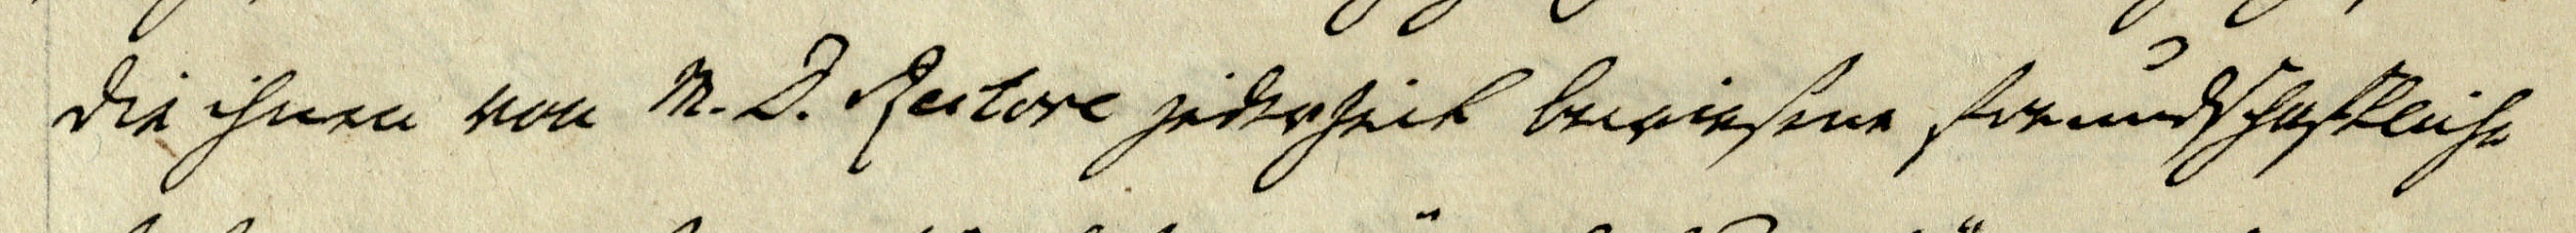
die ihnen von M. D. Rectore jederzeit bewiesene freundschaftliche
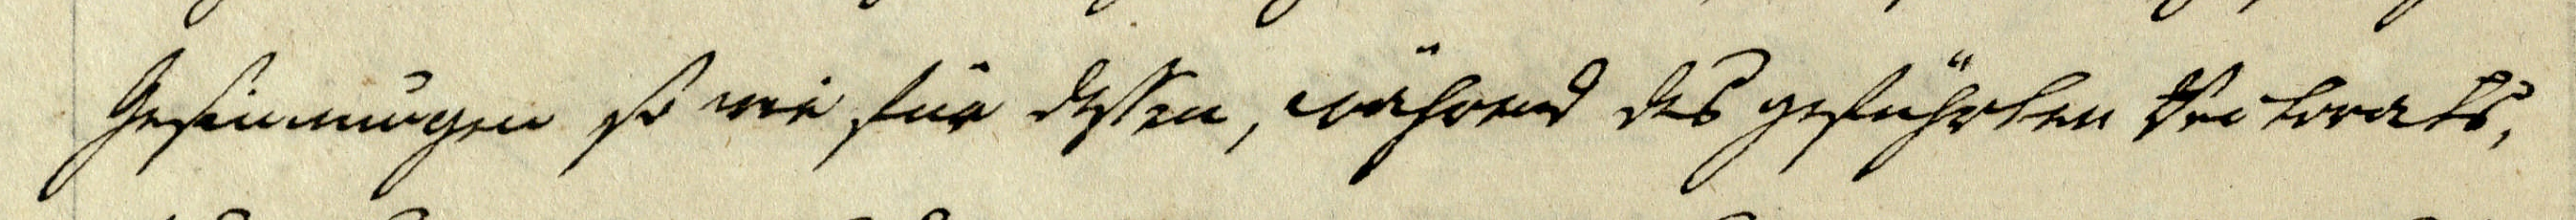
Gesinnungen so wie für dessen, während des geführten Rectorats,
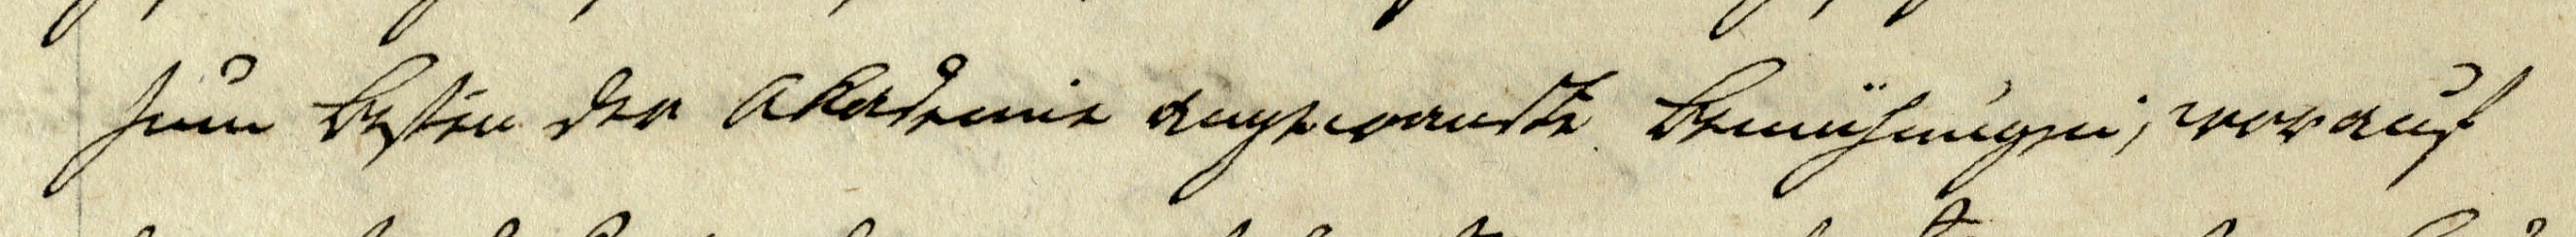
zum Besten der Akademie angewandte Bemühungen, worauf
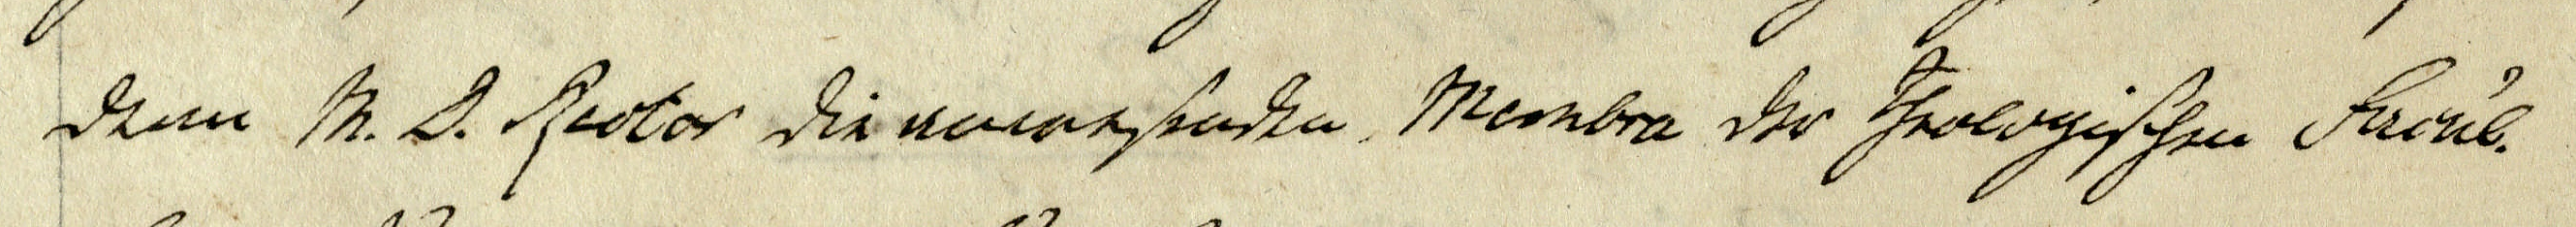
dem M. D. Rector die anwesenden Membra der Theologischen Facul¬
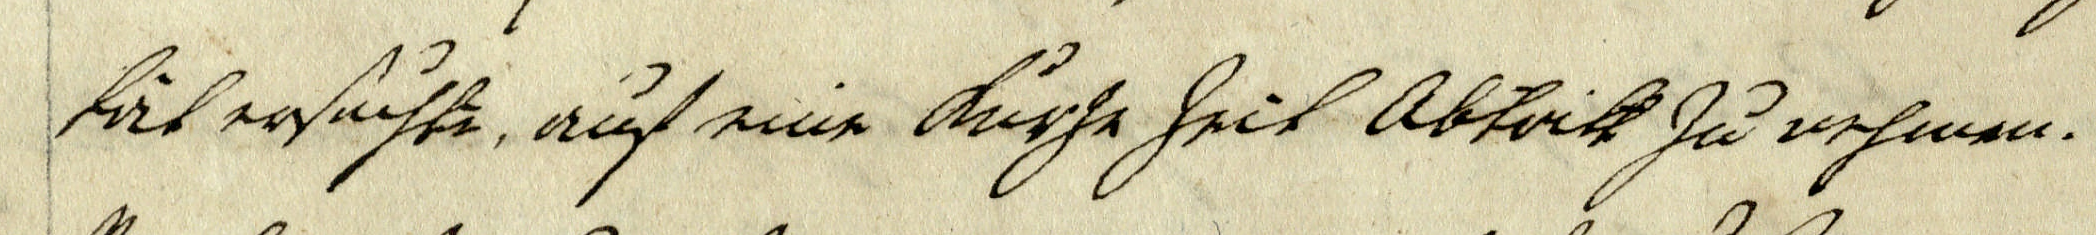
tät ersuchte, auf eine kurze Zeit Abtritt zu nehmen.
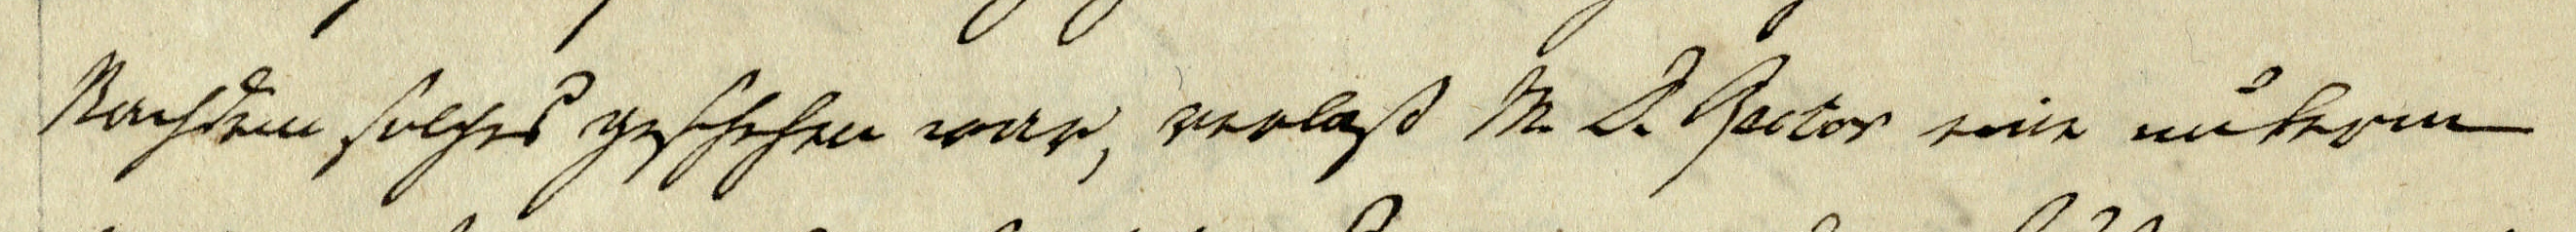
Nachdem solches geschehen war, verlaß M. D. Rector eine unterm
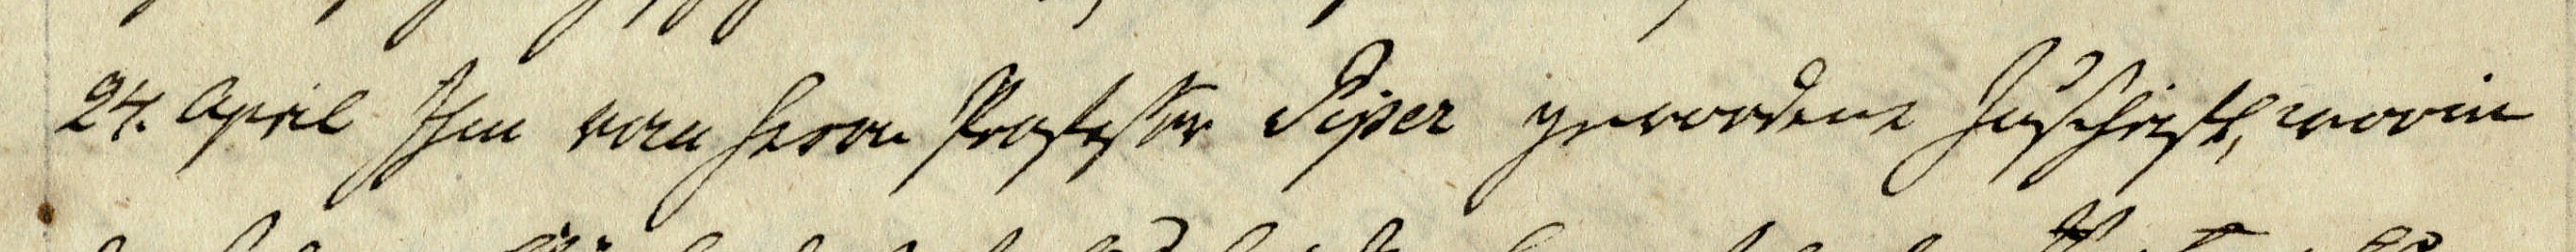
24. April Ihm von Herrn Professor Piper gewordene Zuschrift, worin
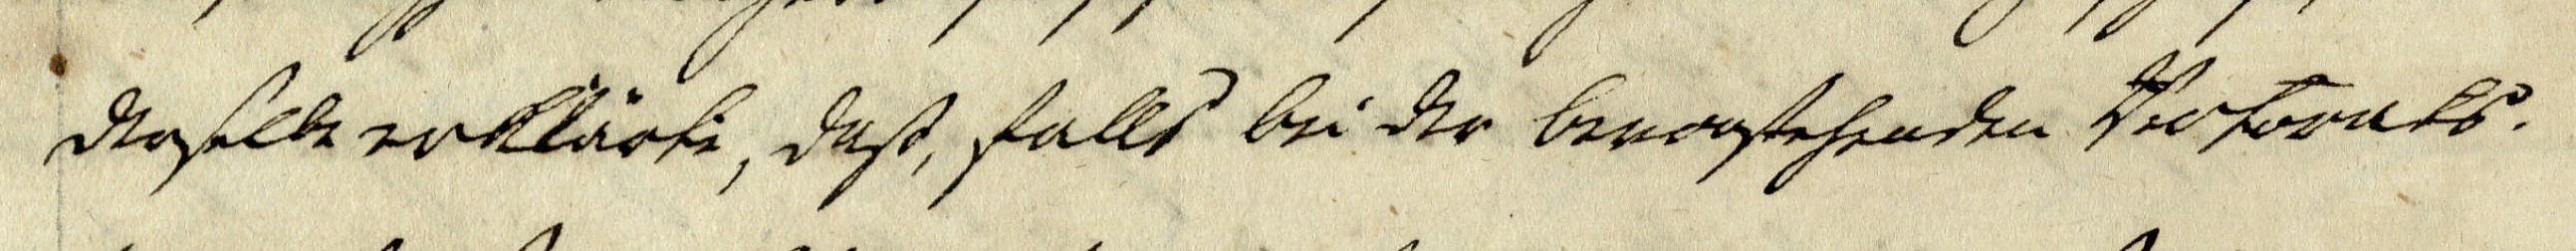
derselbe erklärte, daß, falls bei der bevorstehenden Rectorats¬
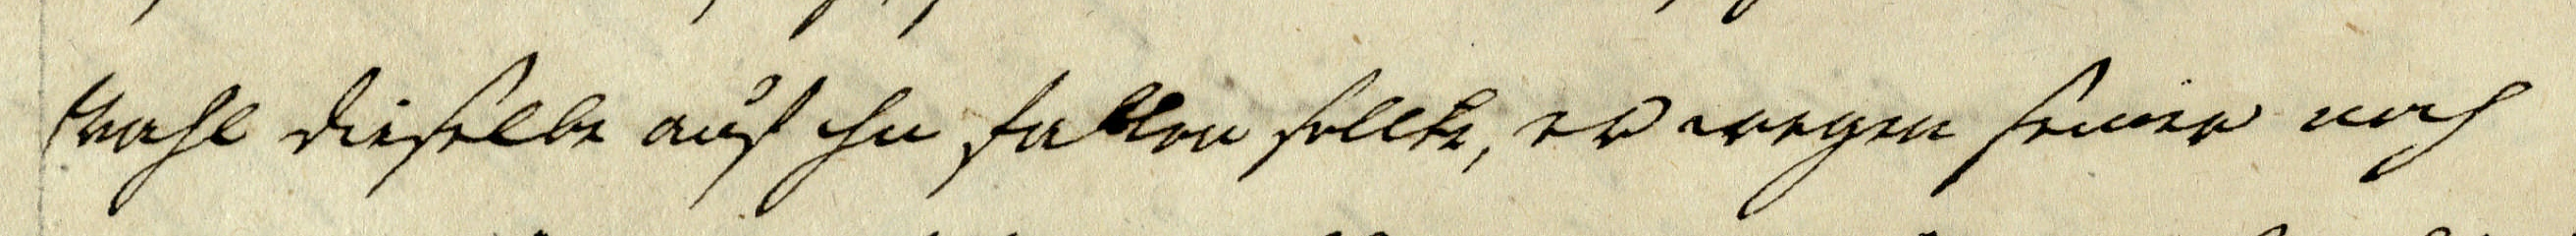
Wahl dieselbe auf ihn fallen sollte, er wegen seiner noch
